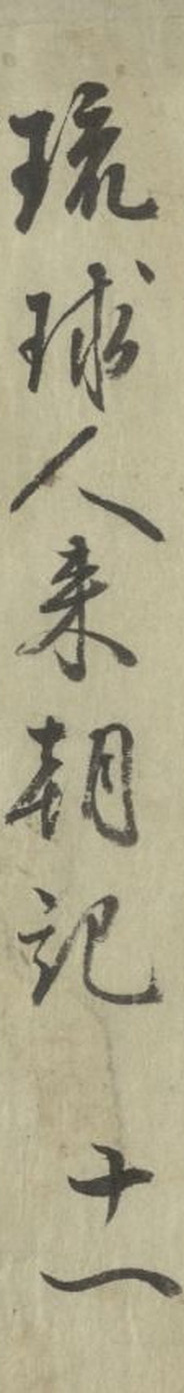琉球人来朝記十一

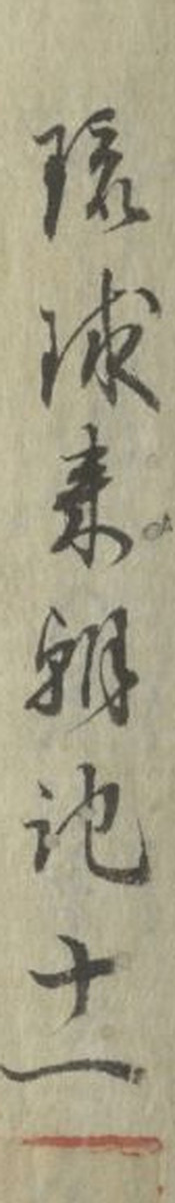琉球来朝記十二
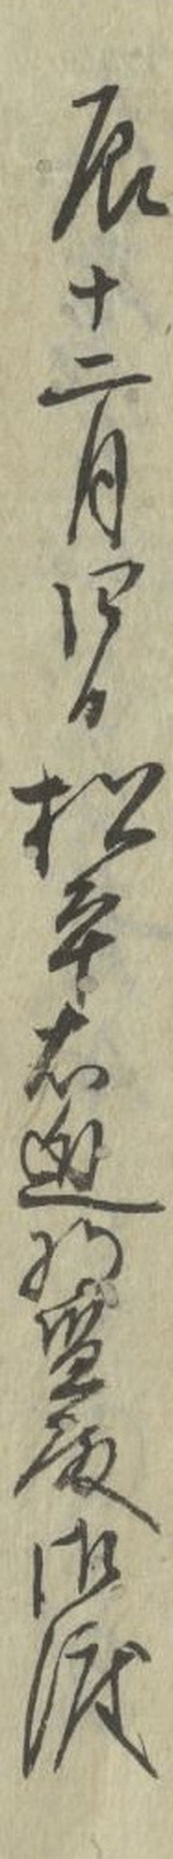辰十二月四日松平右近将監殿御渡
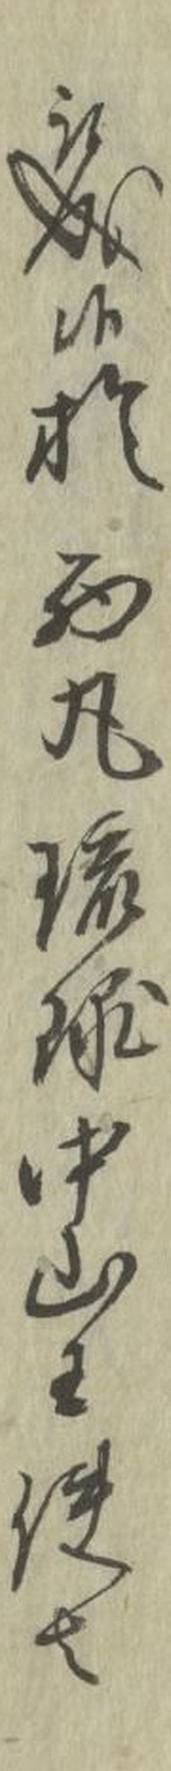被成候於西丸琉球中山王使者
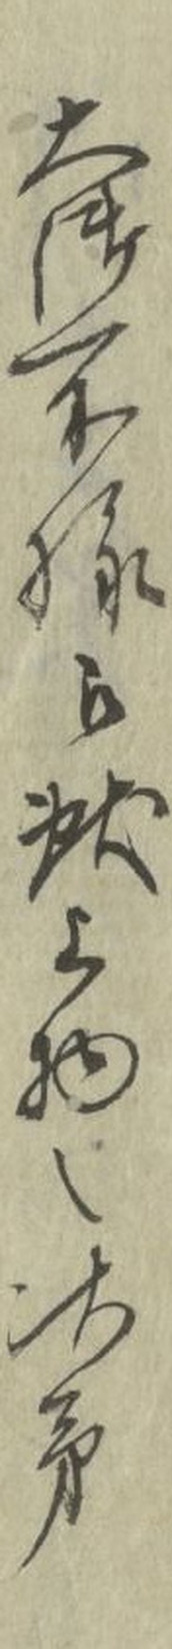大御所様被献上物之次第
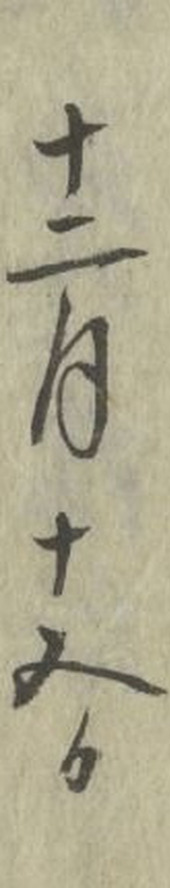十二月十五日

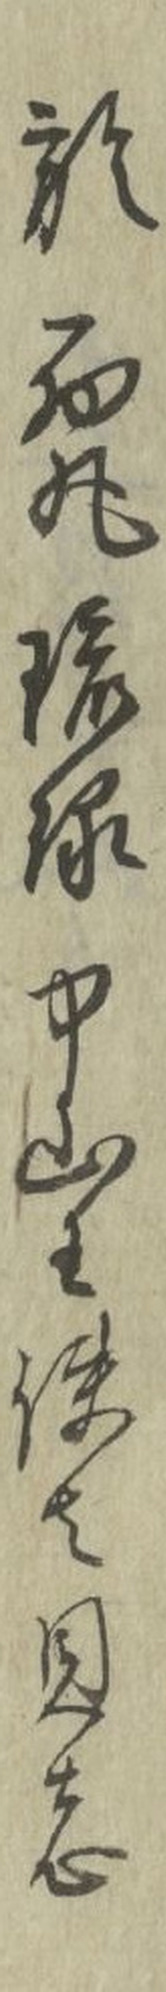於西丸琉球中山王使者具志
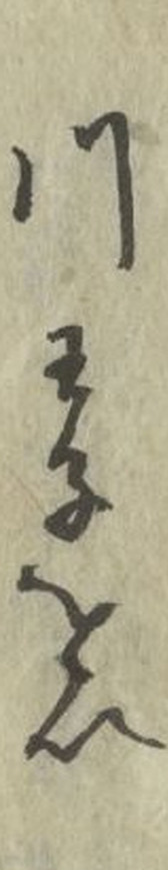川王子を以
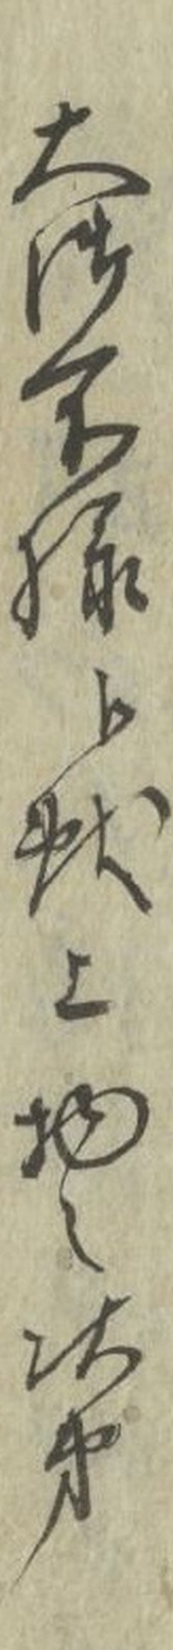大御所様え献上物之次第
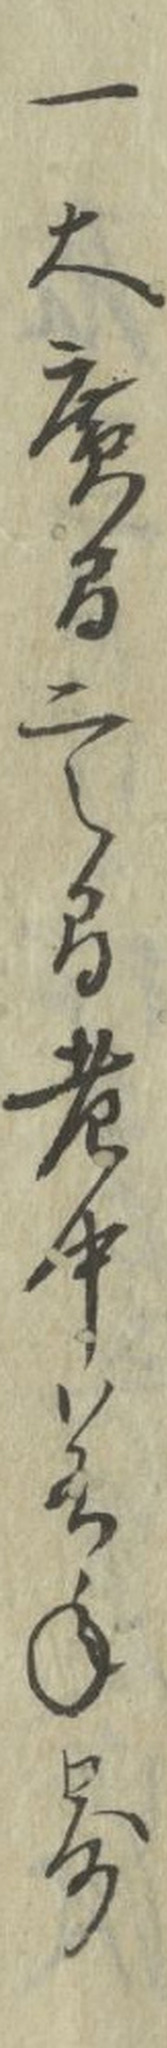一大広間二之間老中若年寄
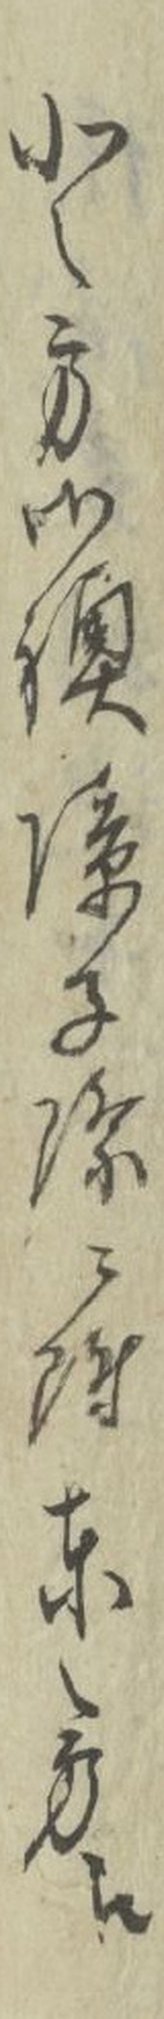北之方御襖障子際に附東之方え
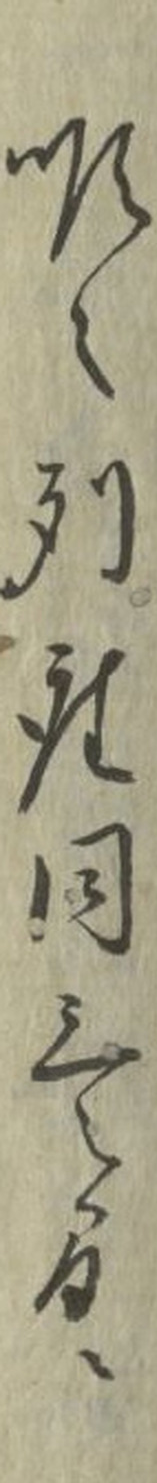順々列座同三之間に
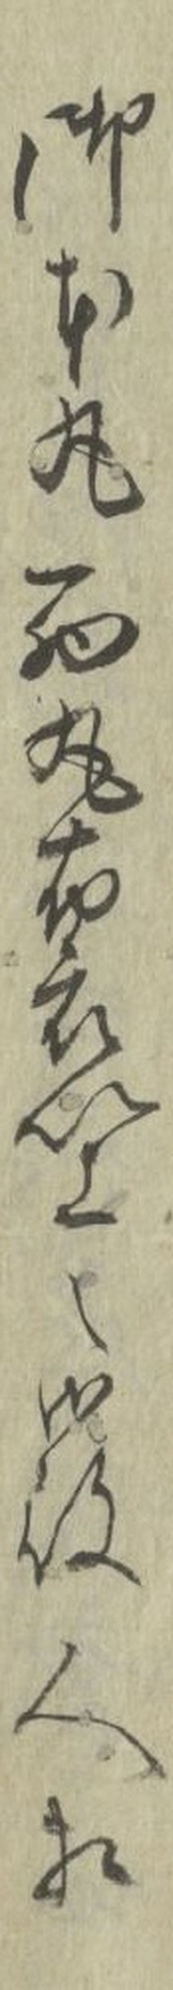御本丸西丸布衣以上之御役人相
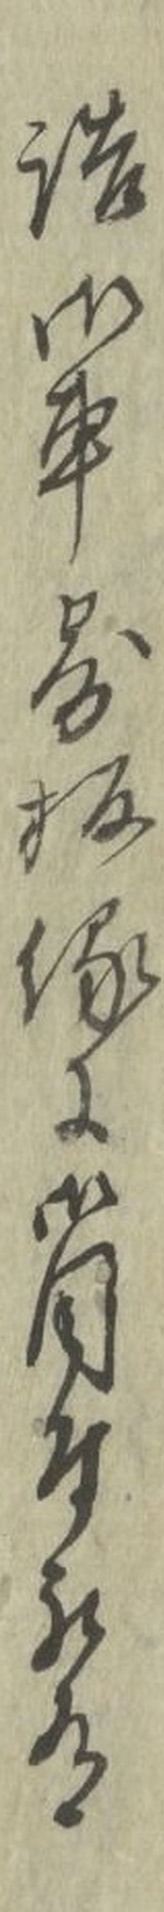詰御車寄板縁に御目詰め罷有
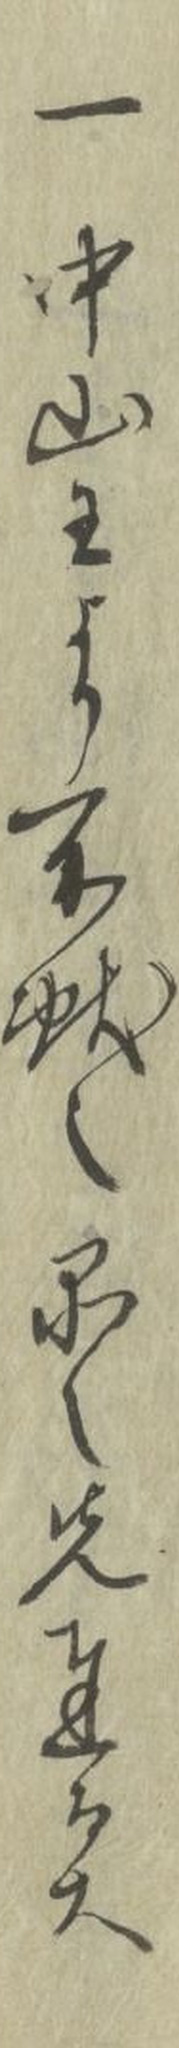一中山王より所献之品之先達而大
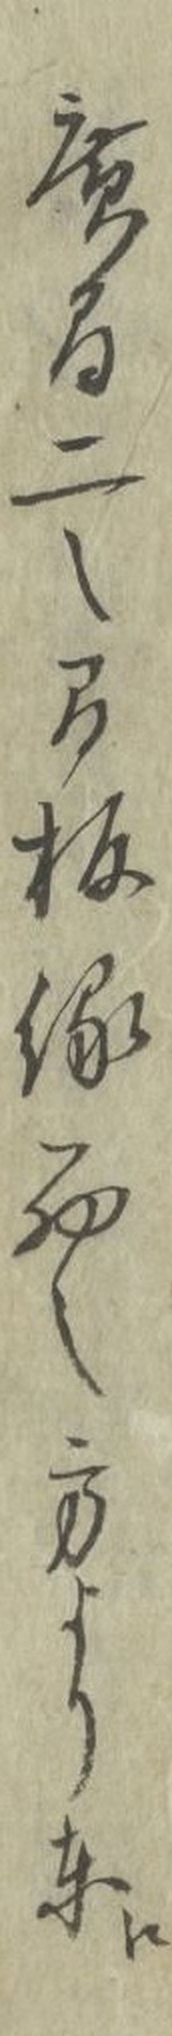広間二之間板縁西之方より東え
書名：琉球来朝記 自八至十四終
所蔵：University of the Ryukyus Library
